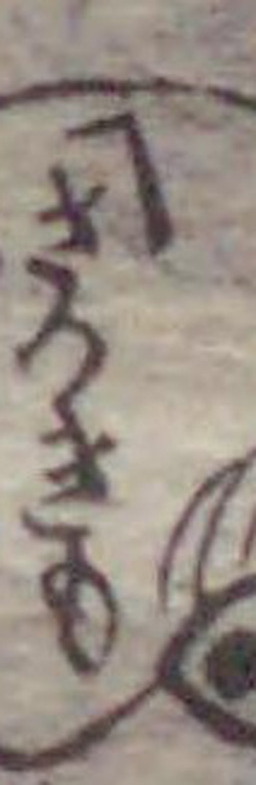〽さつきも
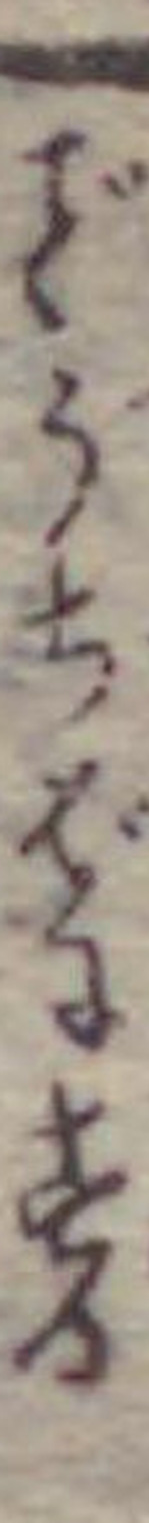ごとかちばにする
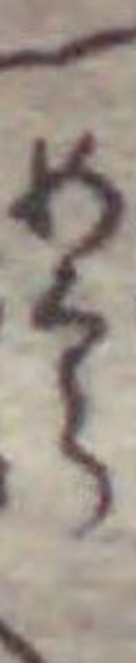めくら
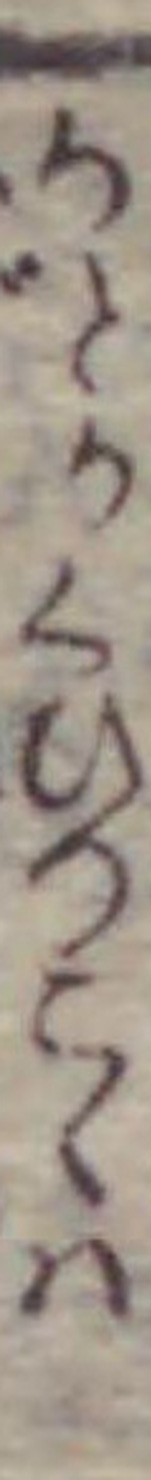かとかくひつこくは
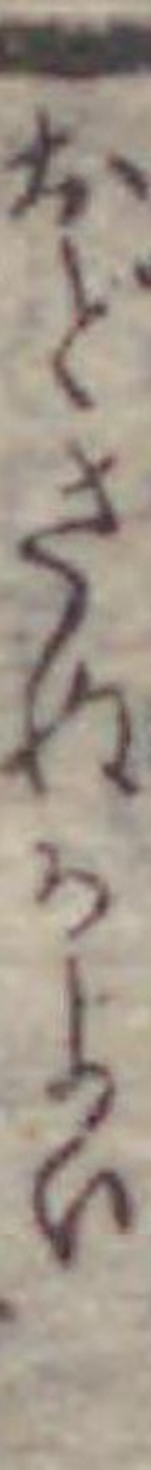おどさぬかよい
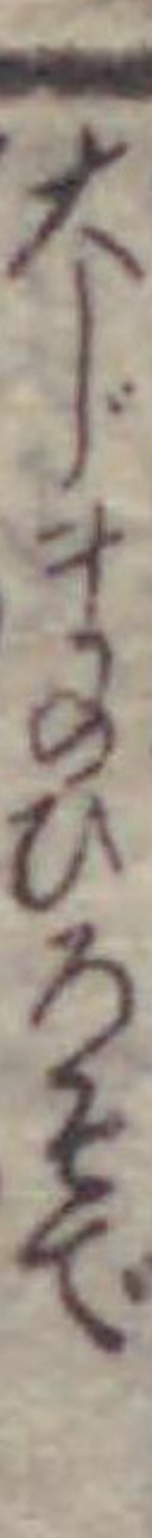大じまのひろそで
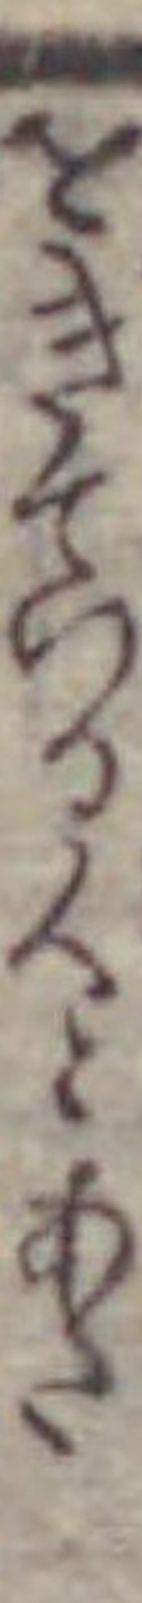をきている人とあた
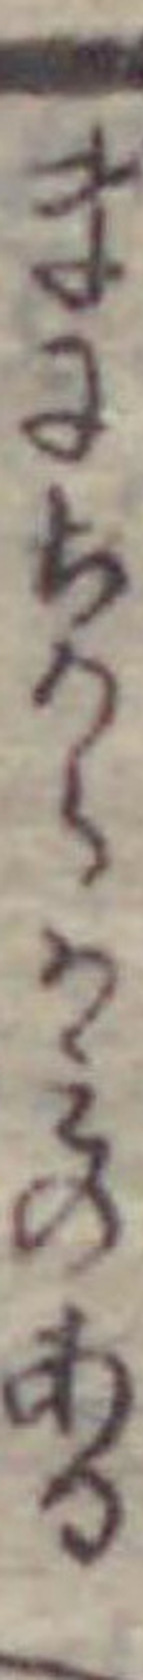まにちからかみのある
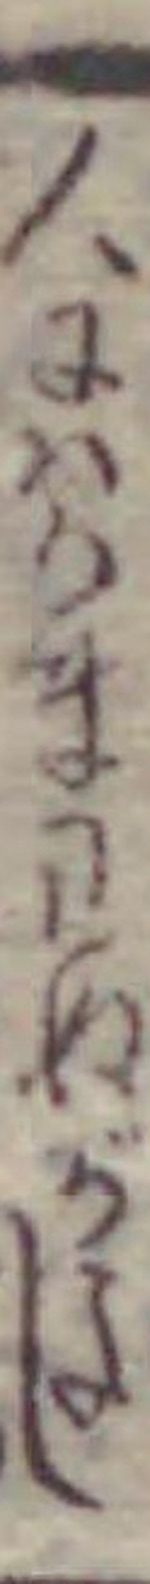人にはかまわぬがよし
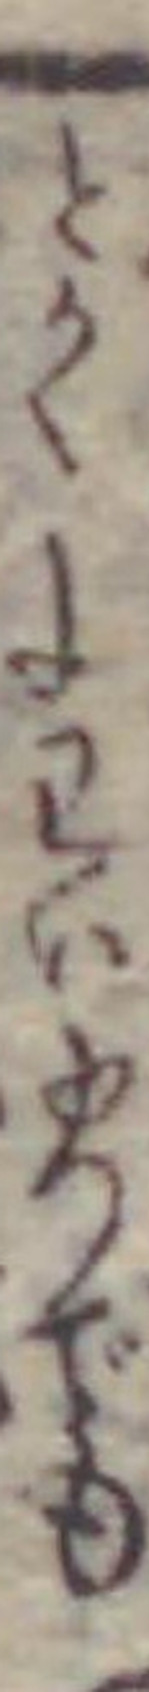とかくよわいやつでも
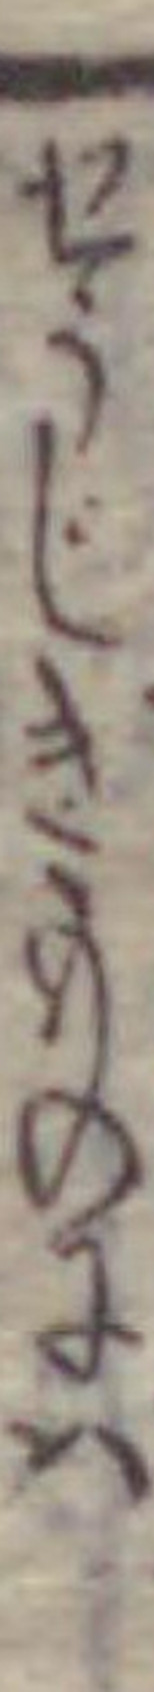せうきものには
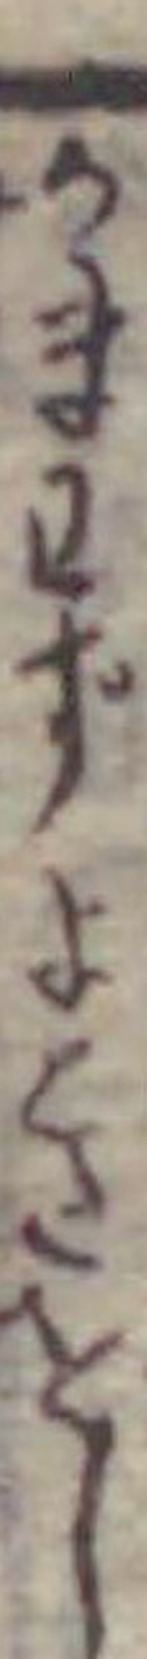かまわずよこたをし
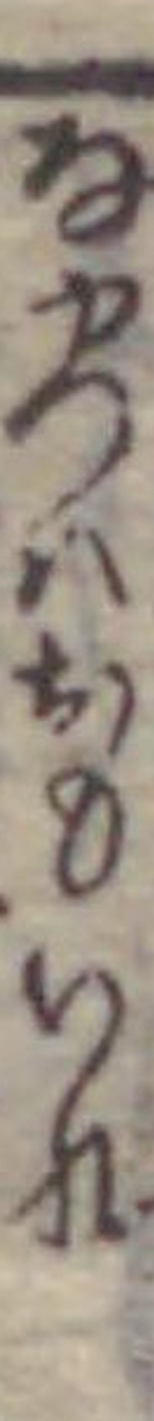なやつはおもいれ
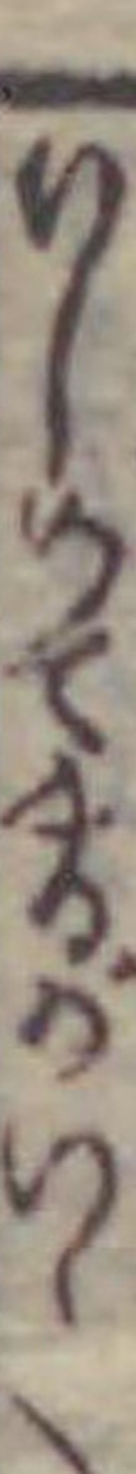いしめてやるがいゝ
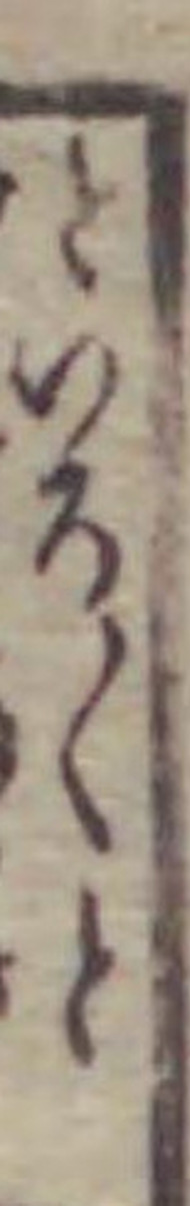といろ〳〵と
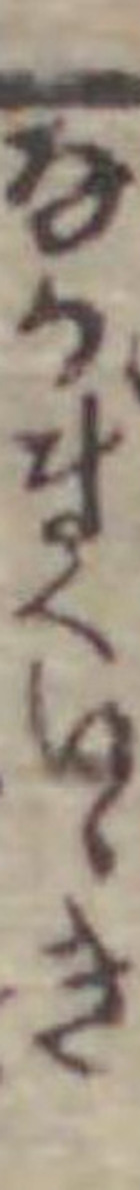なかまへいゝき
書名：化物見世開 : 2巻
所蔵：国立国会図書館 National Diet Library, JAPAN
